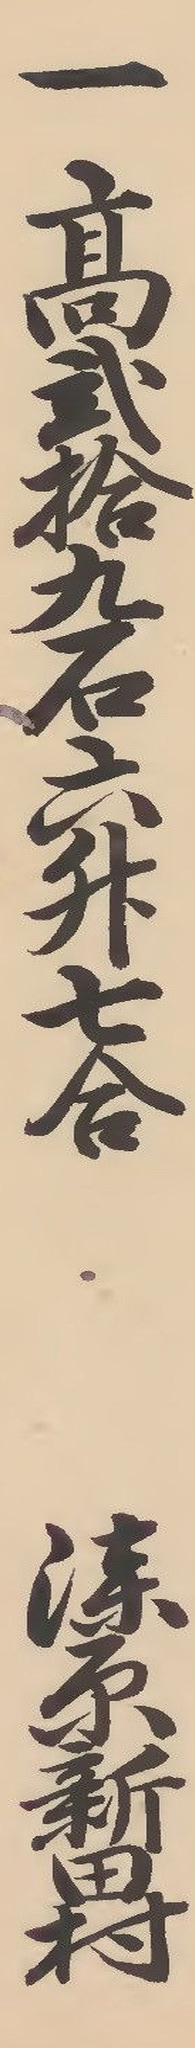一高弐拾九石六升七合漆原新田村

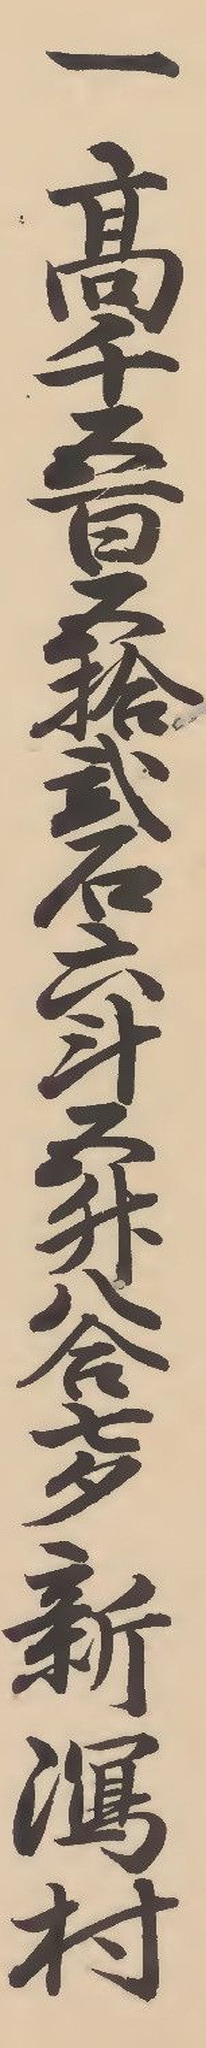一高千五百五拾弐石六斗五升八合七勺新潟村
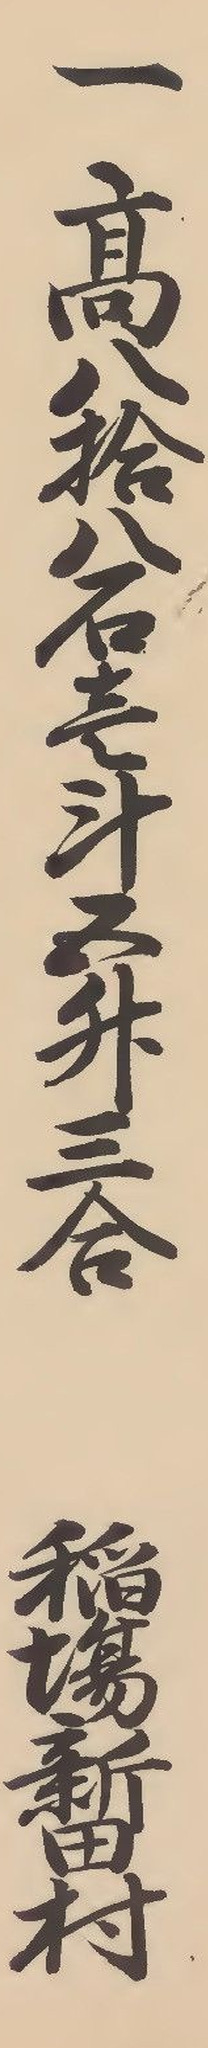一高八拾八石壱斗五升三合稲場新田村
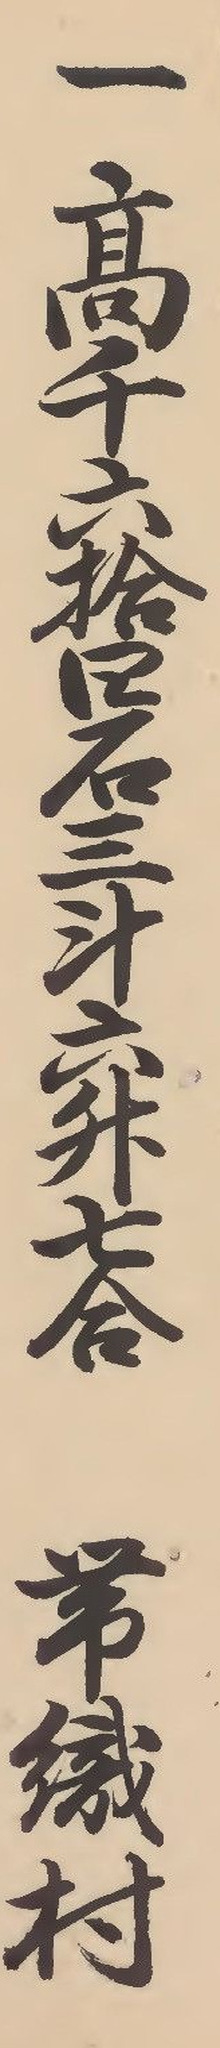一高千六拾四石三斗六升七合帯織村
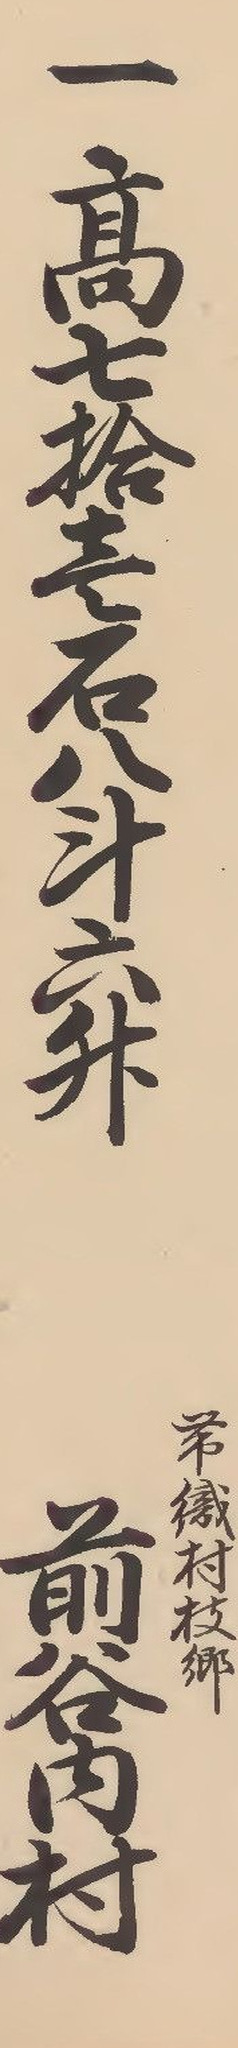一高七拾壱石八斗六升前谷内村
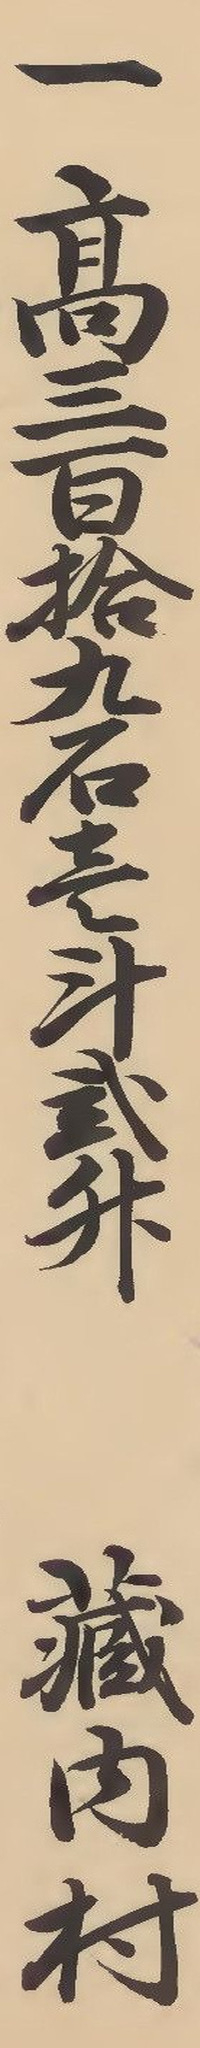一高三百拾九石壱斗弐升蔵内村
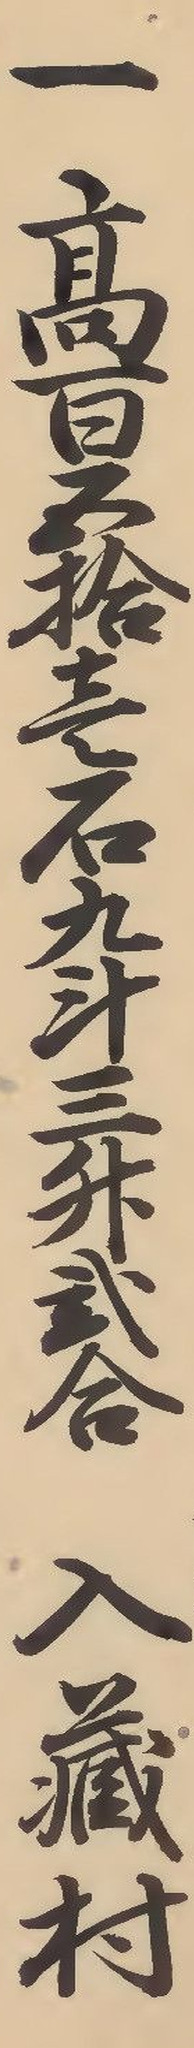一高百五拾壱石九斗三升弐合入蔵村
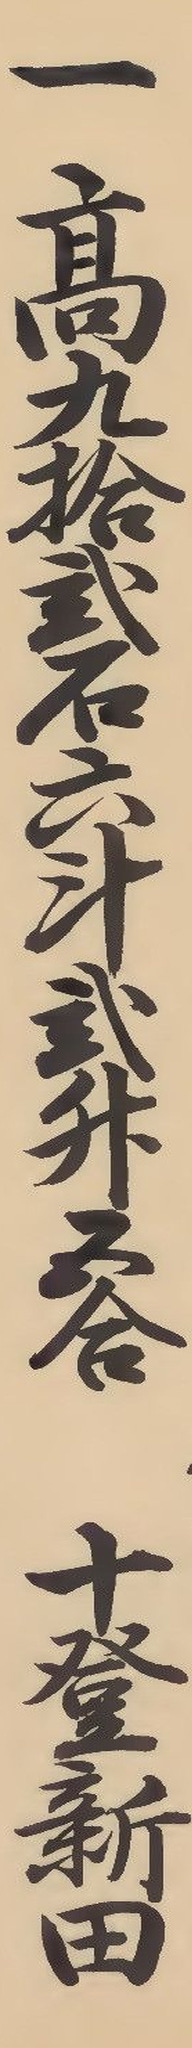一高九拾弐石六斗弐升五合十登新田
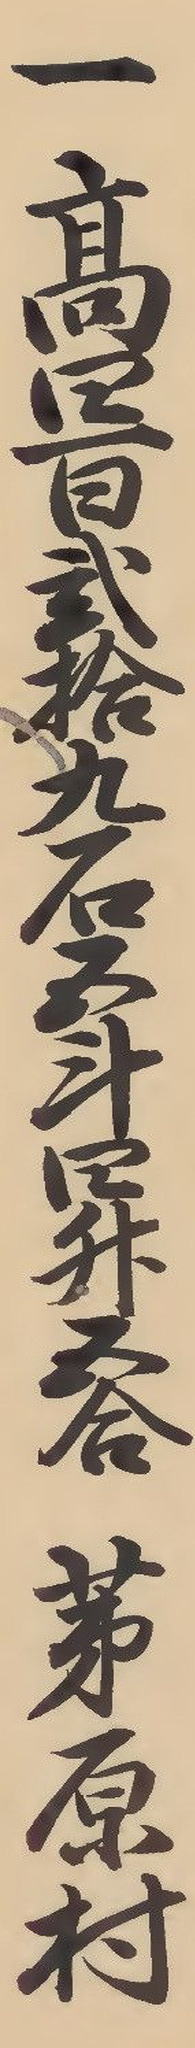一高四百弐拾九石五斗四升五合茅原村

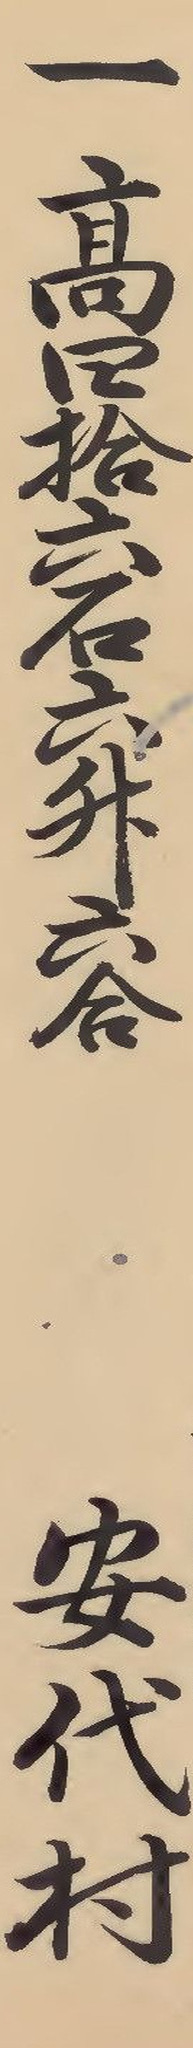一高四拾六石六升六合安代村
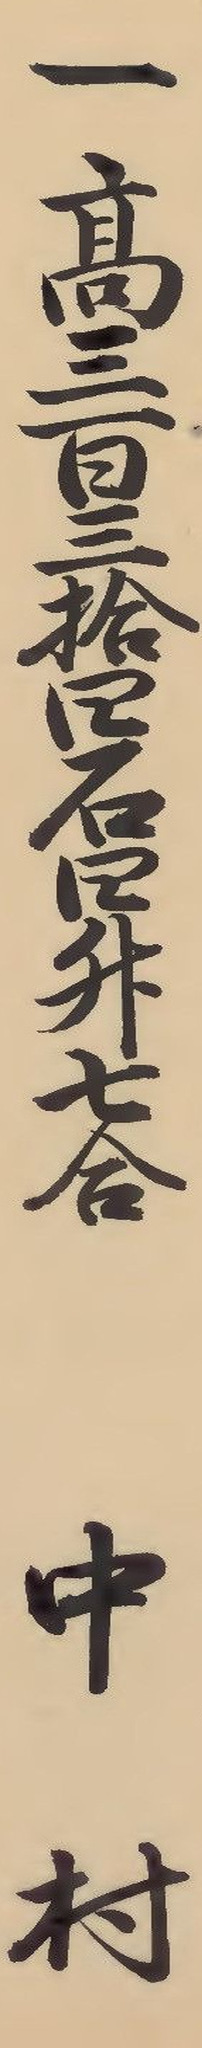一高三百三拾四石四升七合中村
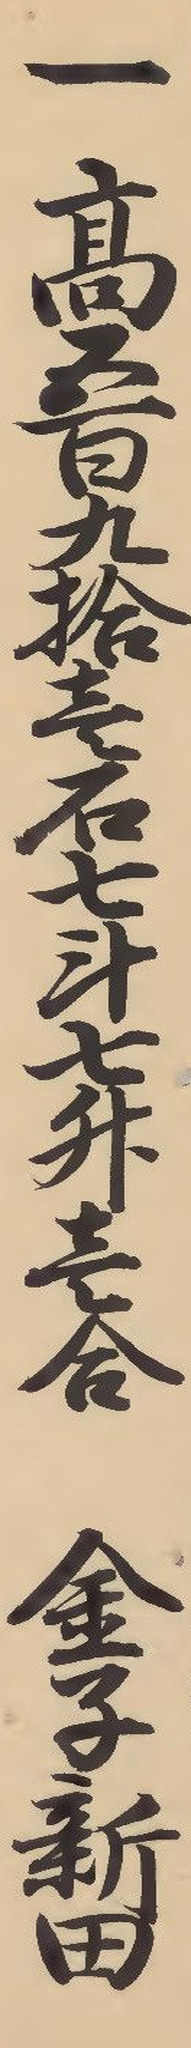一高五百九拾壱石七斗七升壱合金子新田
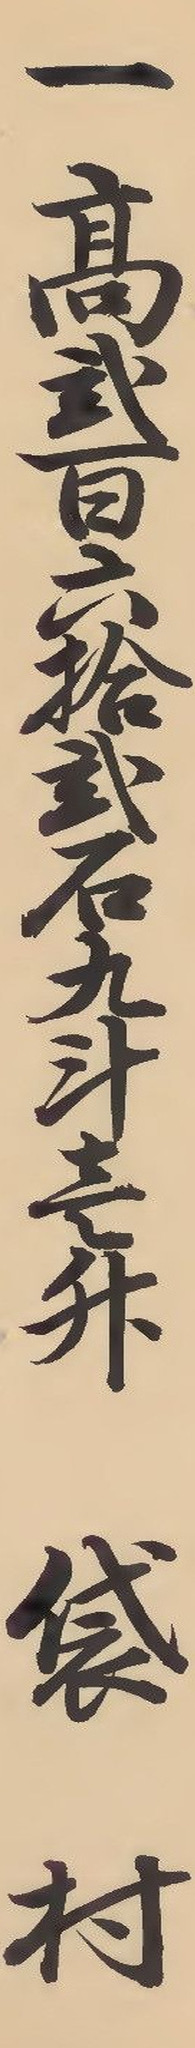一高弐百六拾弐石九斗壱升袋村
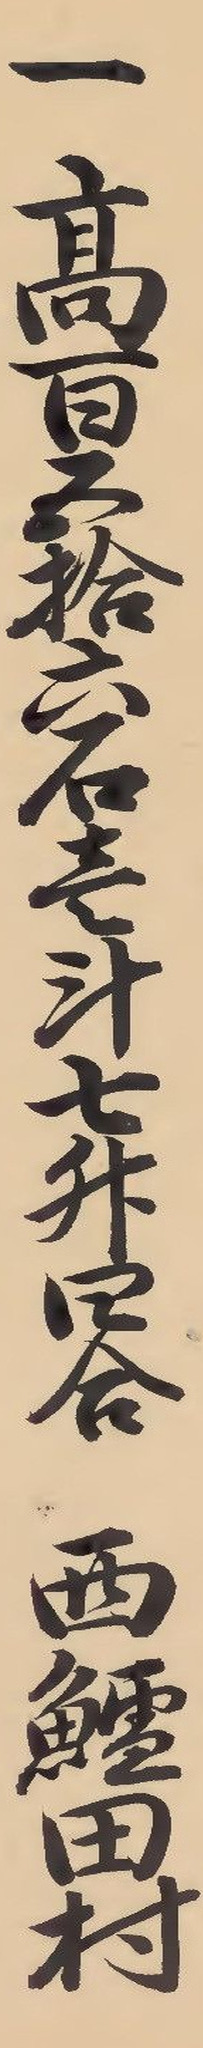一高百五拾六石壱斗七升四合西鱈田村
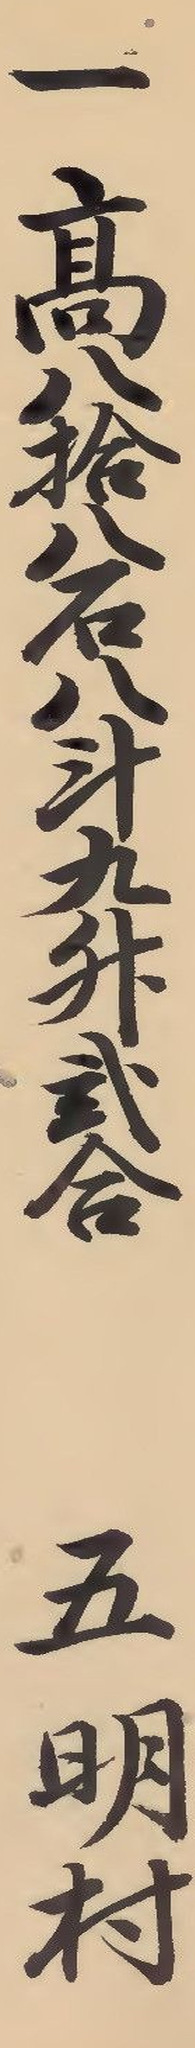一高八拾八石八斗九升弐合五明村
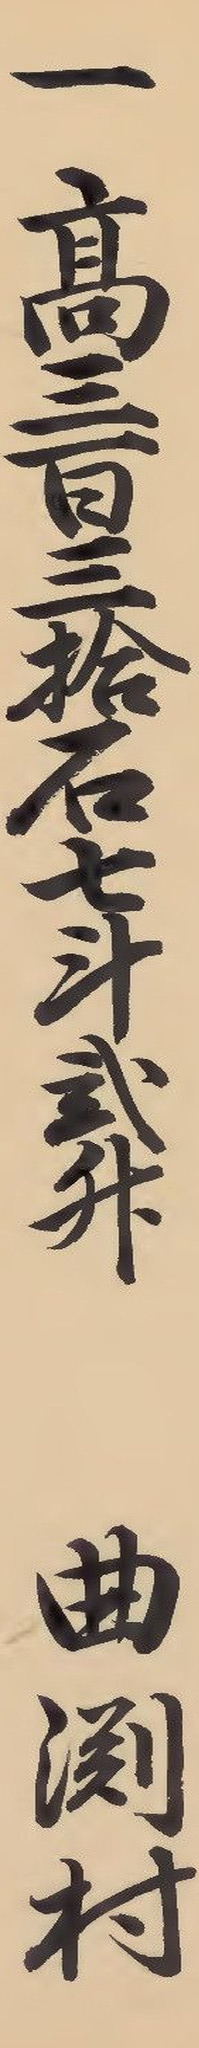一高三百三拾石七斗弐升曲淵村
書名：越後国郷帳　下
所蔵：国立公文書館 National Archives of Japan
